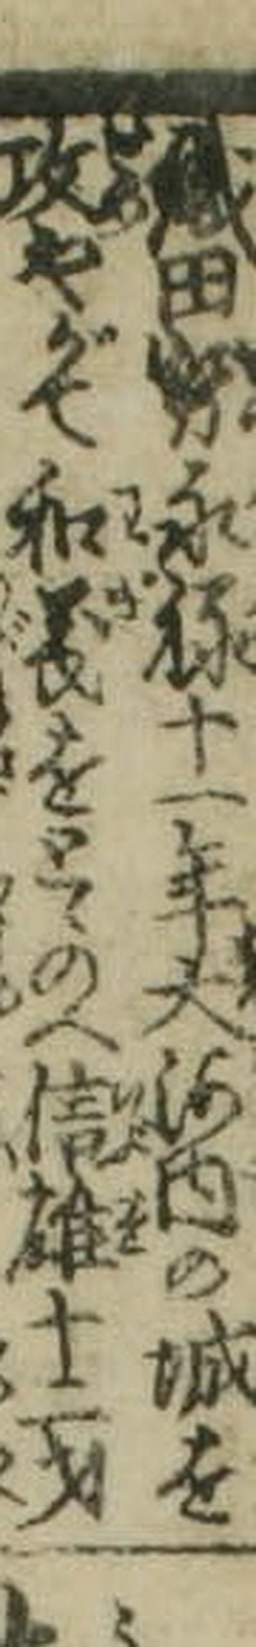攻やがて和義をとゝのへ信雄十二才
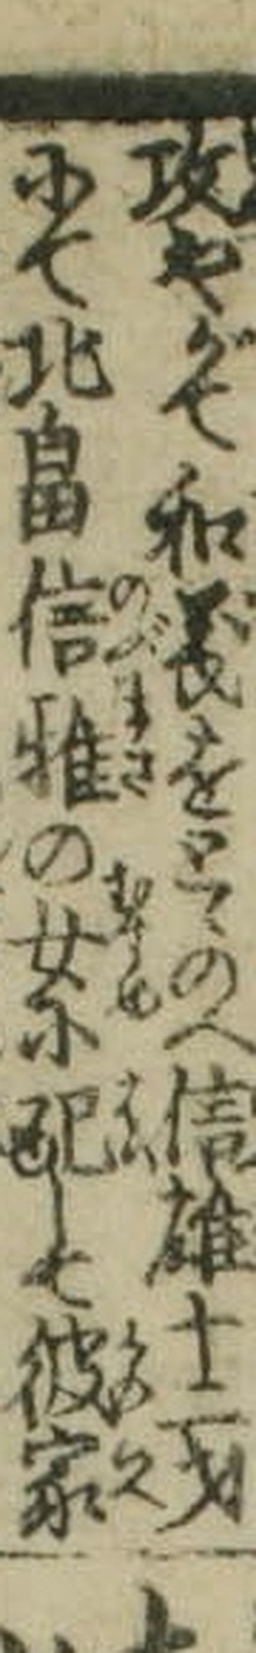にて北畠信雅の女に配して彼家
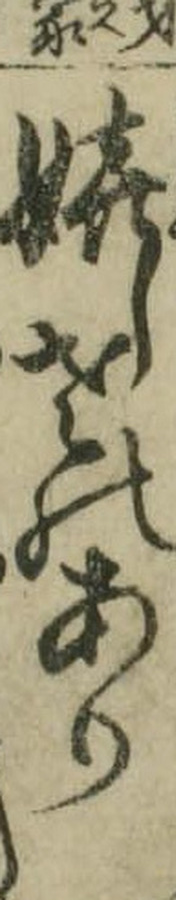嬉しさのあり
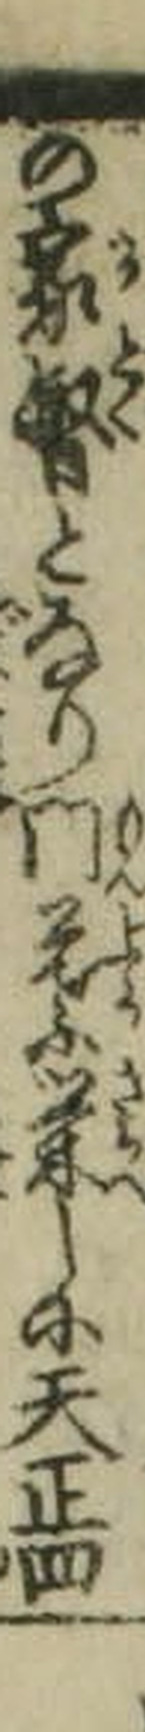の家督となり門若ふ栄しに天正四
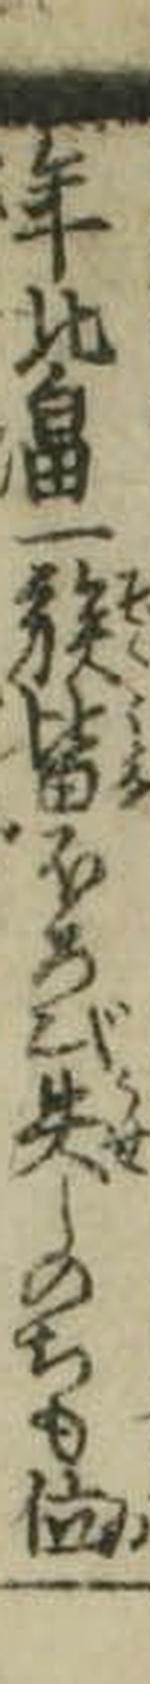年北畠一族皆ほろび失しのちも位
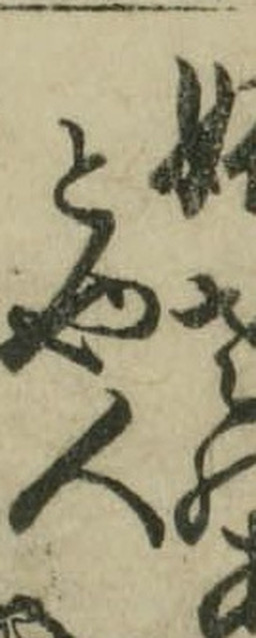とや人
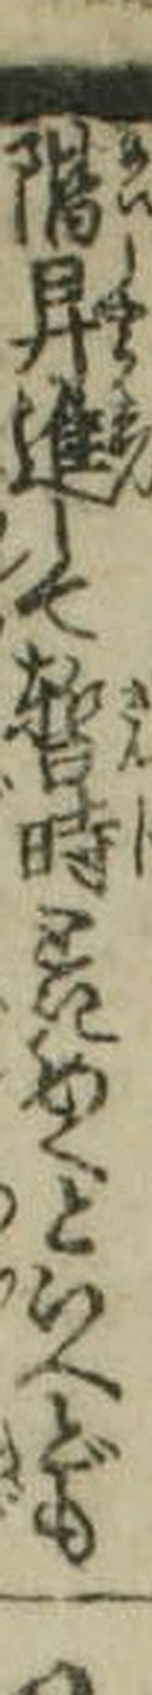階昇進して暫時ときめくといへども
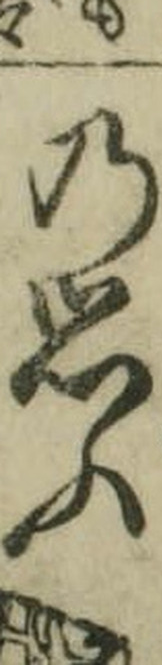の思ふ
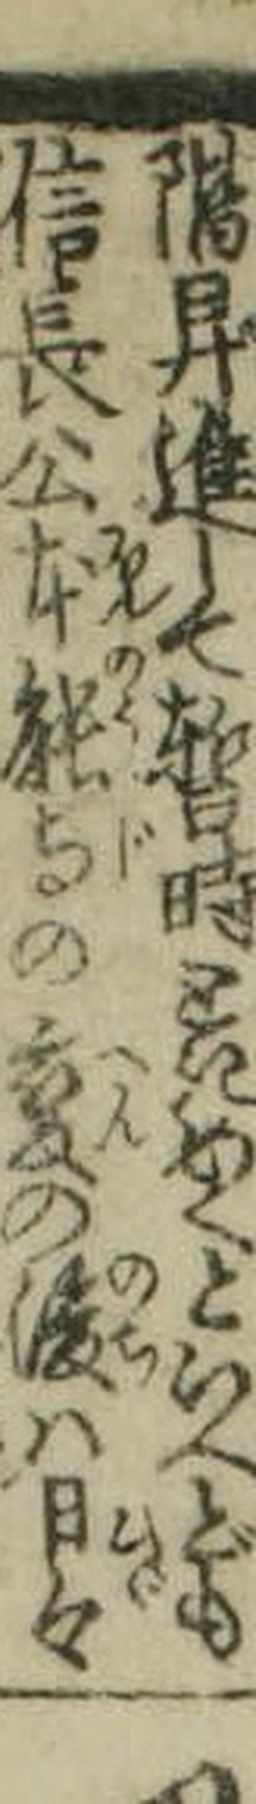信長公本能寺の変の後は日々
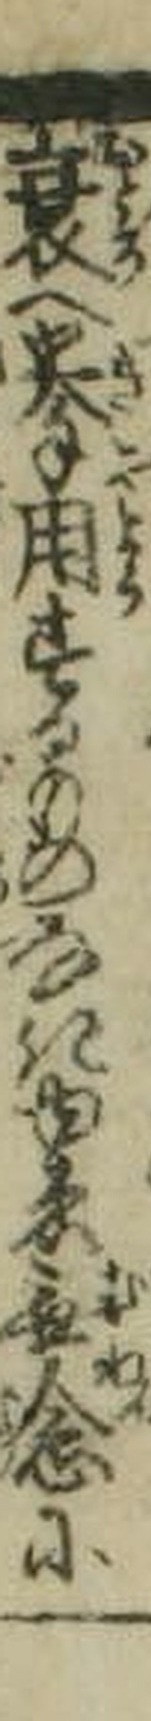衰へ挙用するものなきゆゑ無念に
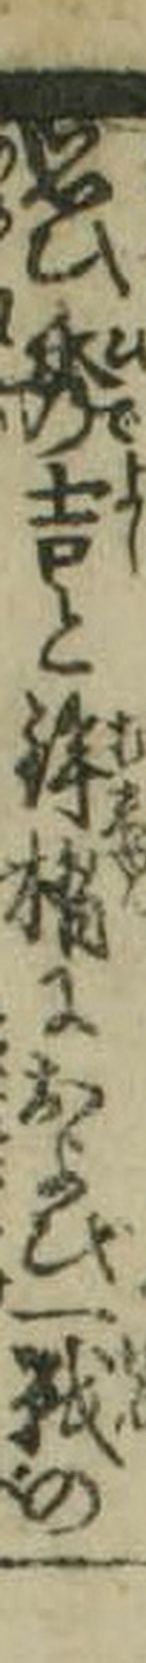思ひ秀吉と鉾楯におよび一戦の
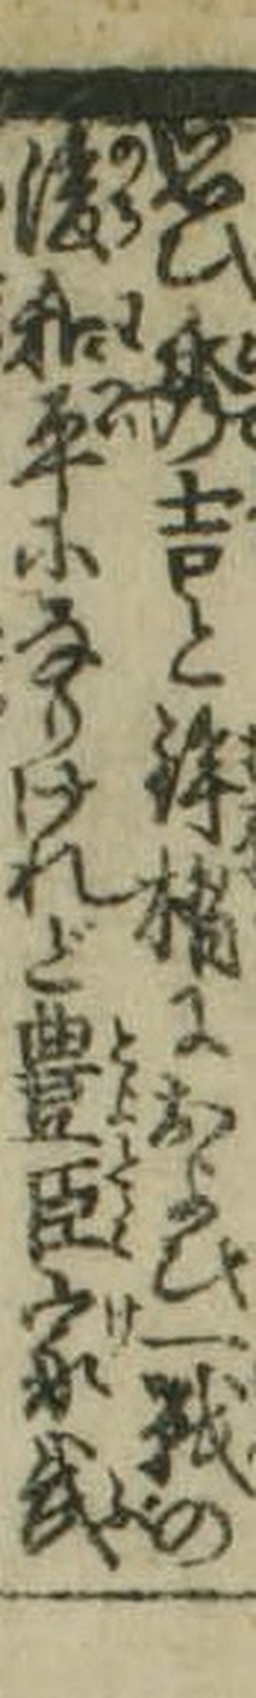後和平になりけれど豊臣家武
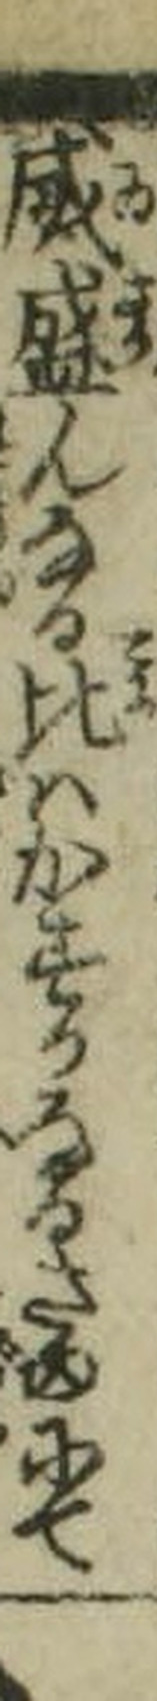威盛んなる頃はかすかなるさまにて
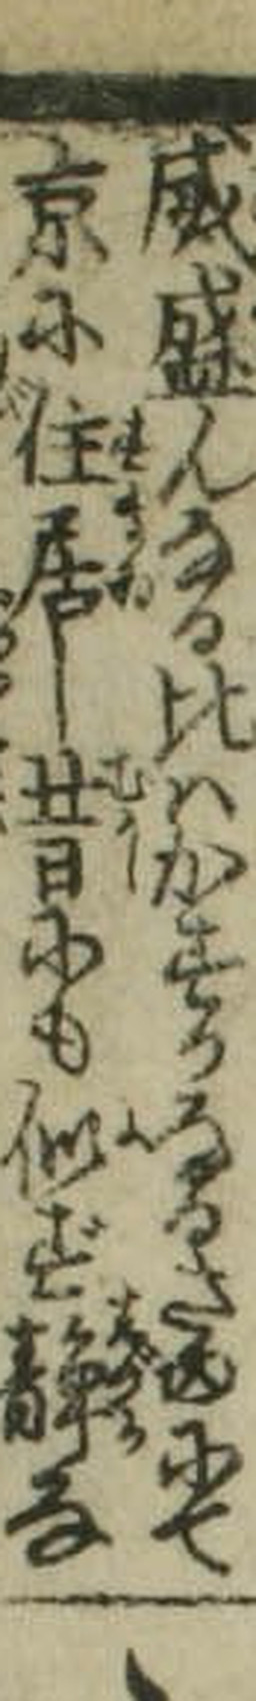京に住居し昔にも似ず静な
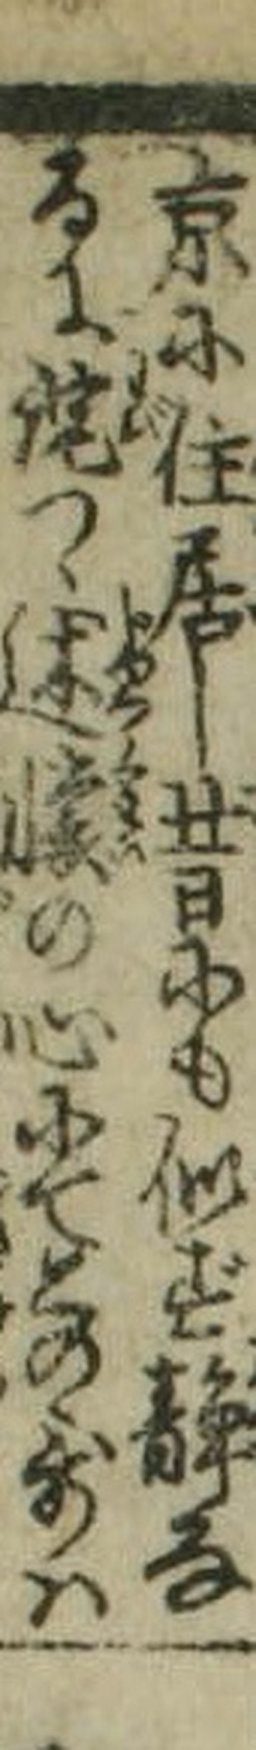るに詫つゝ述懐の心にてこの哥は
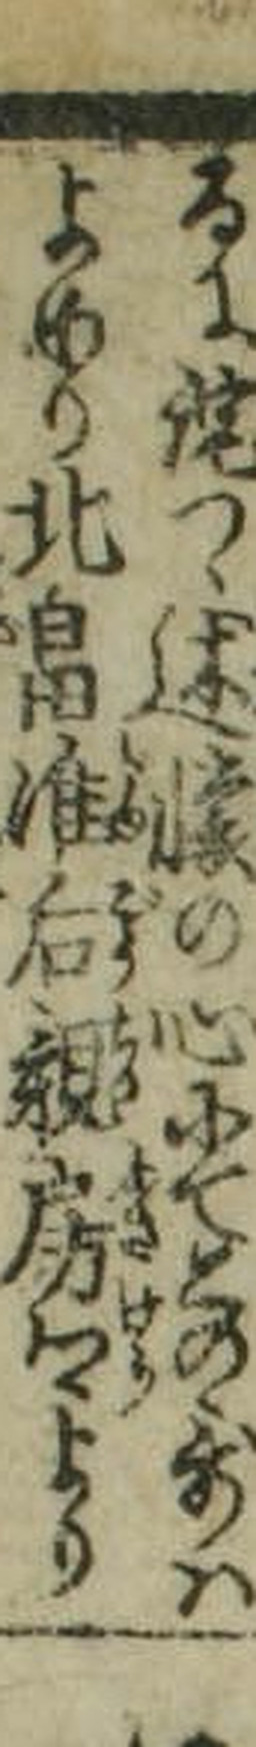よめり北畠准后親房卿より
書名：續英雄百人一首
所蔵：東京学芸大学附属図書館
